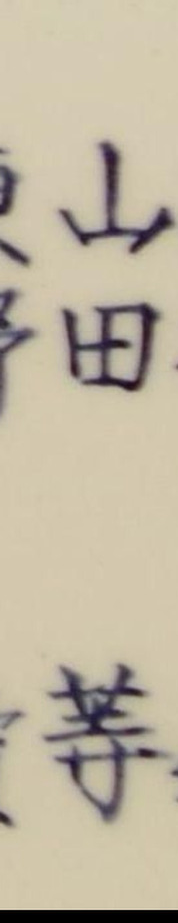山田等
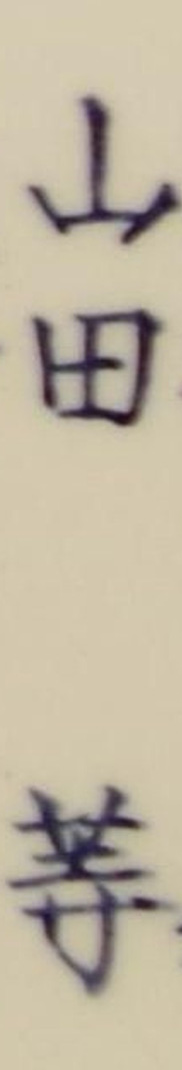山田等
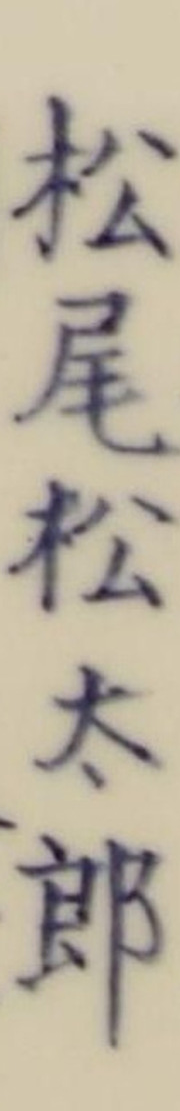松尾松太郎
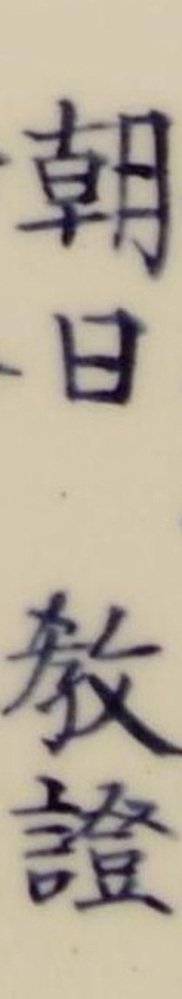朝日教證
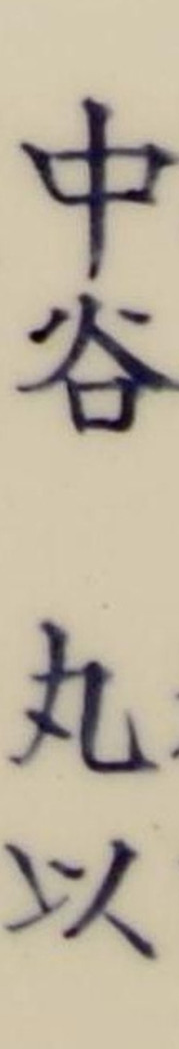中谷丸以
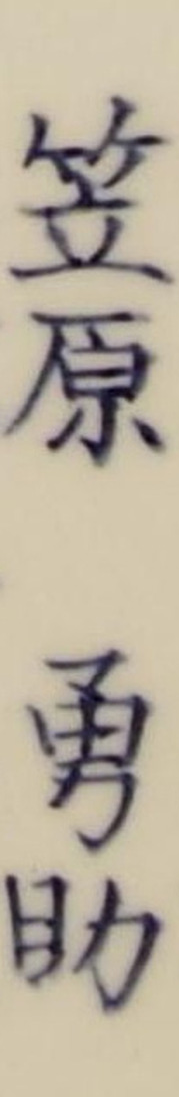笠原勇助
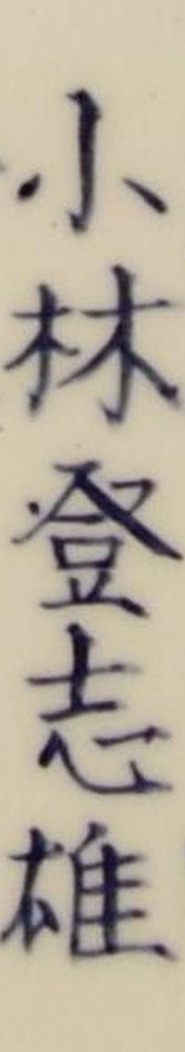小林登志雄
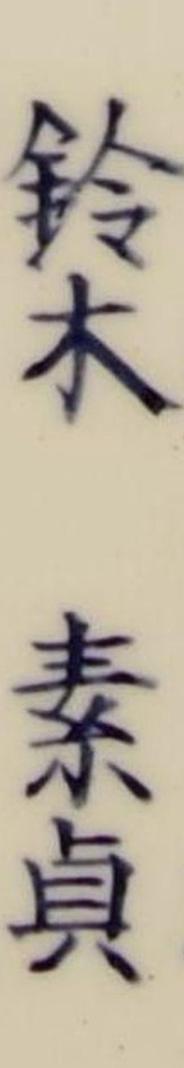鈴木素貞
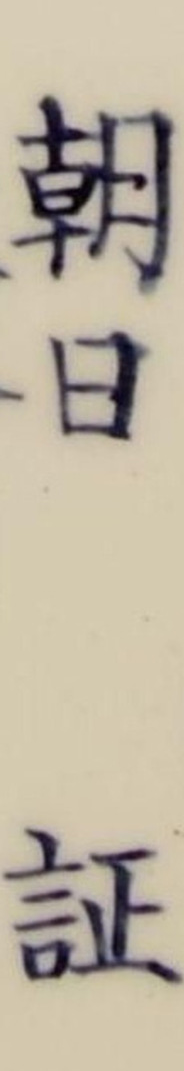朝日証
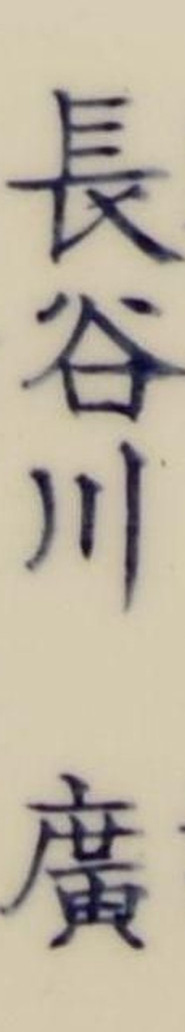長谷川廣
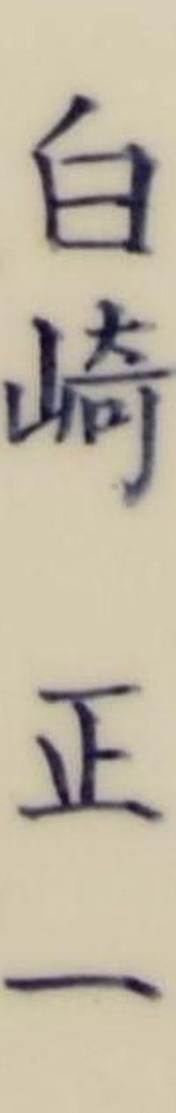白崎正一
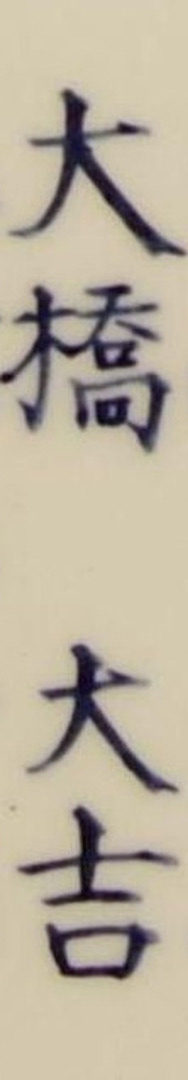大橋大吉
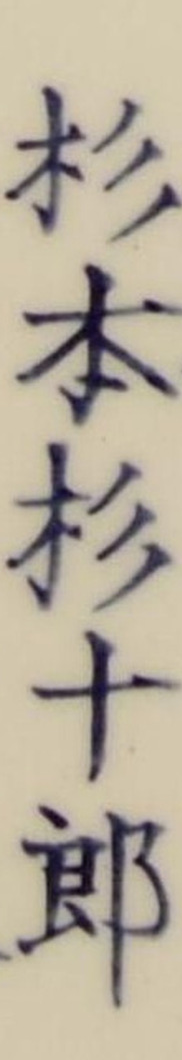杉本杉十郎
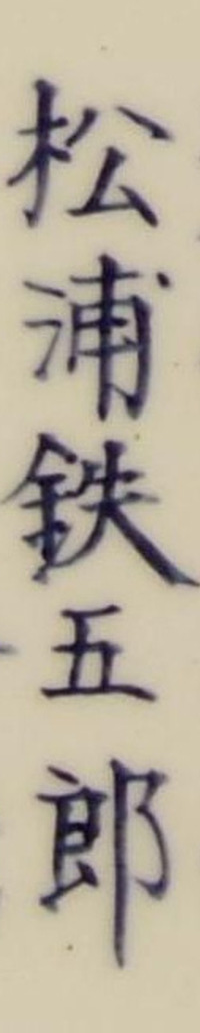松浦鉄五郎
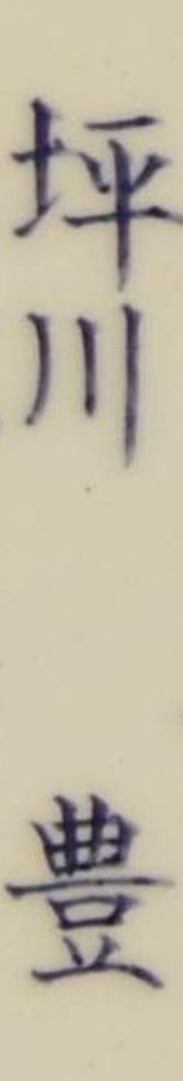坪川豊
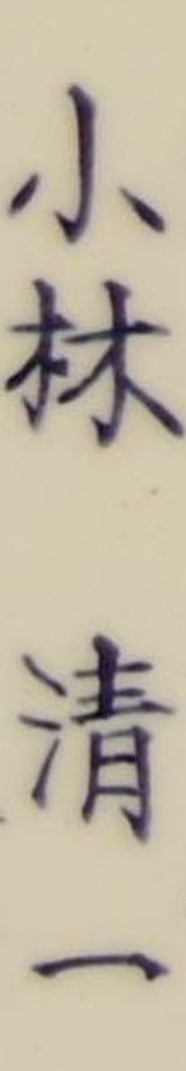小林清一
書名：E~L
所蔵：高野山金剛峯寺
